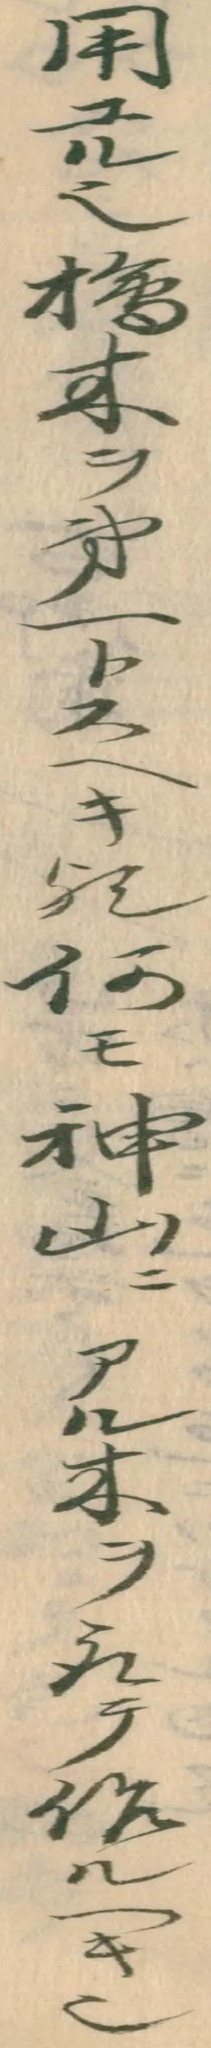用ユル也檜木ヲ第一トスヘキ歟何モ神山ニアル木ヲ取テ作ルヘキ也
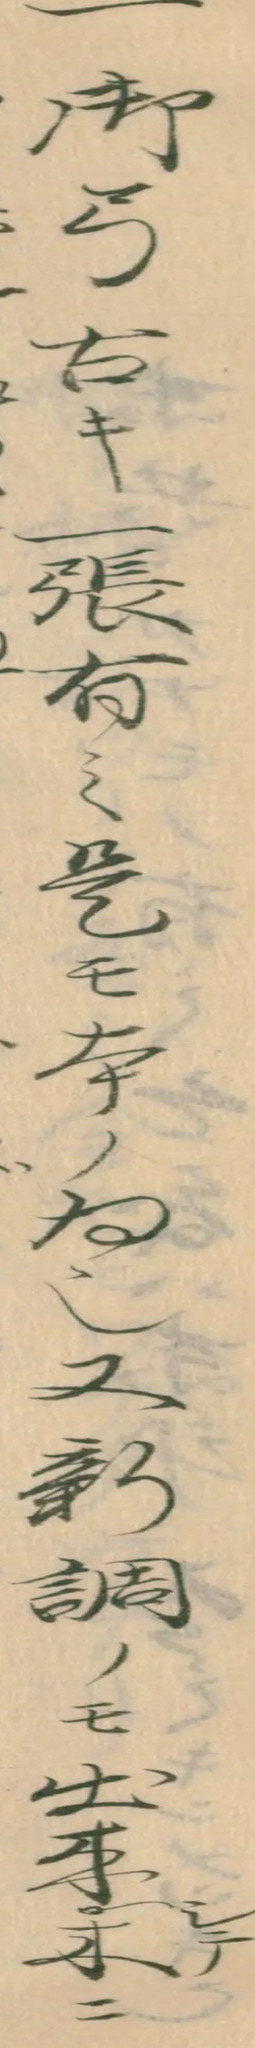一御弓古キ一張有之是モ本ノ為也又新調ノモ出来￮木ニ
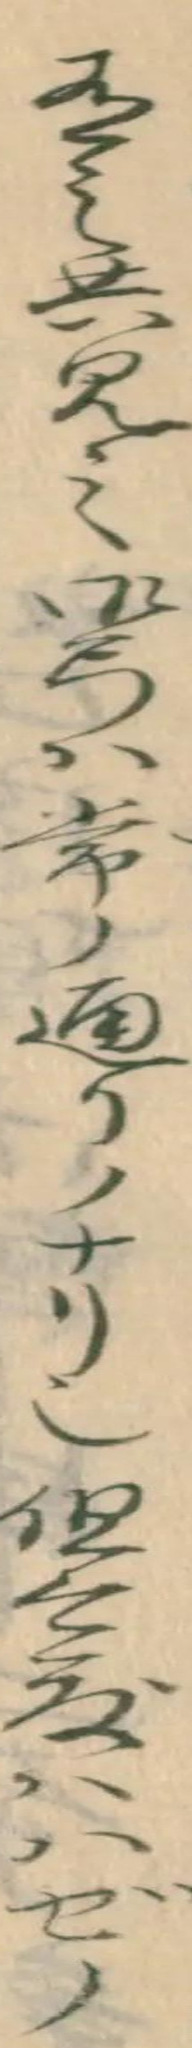有之共見之御弓ハ常ノ通リノナリ也但今度ハハゼノ
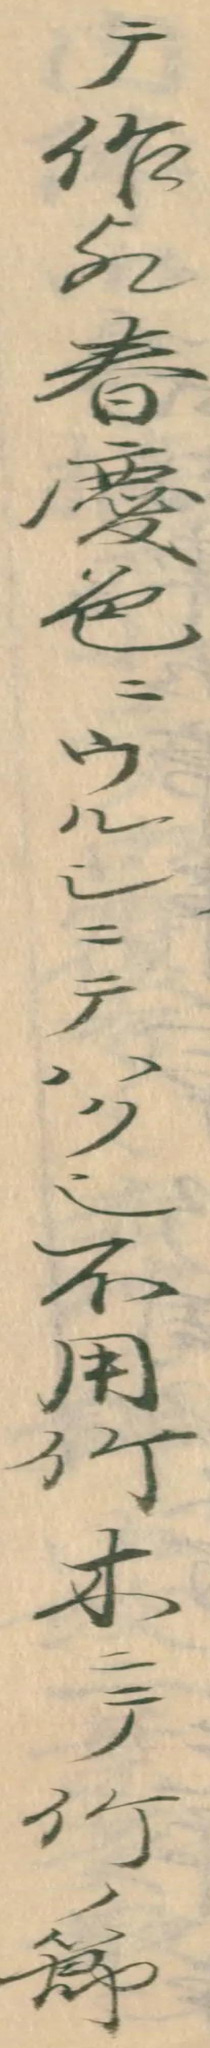テ作歟春慶色ニウルシニテハク也不用竹木ニテ竹ノ節
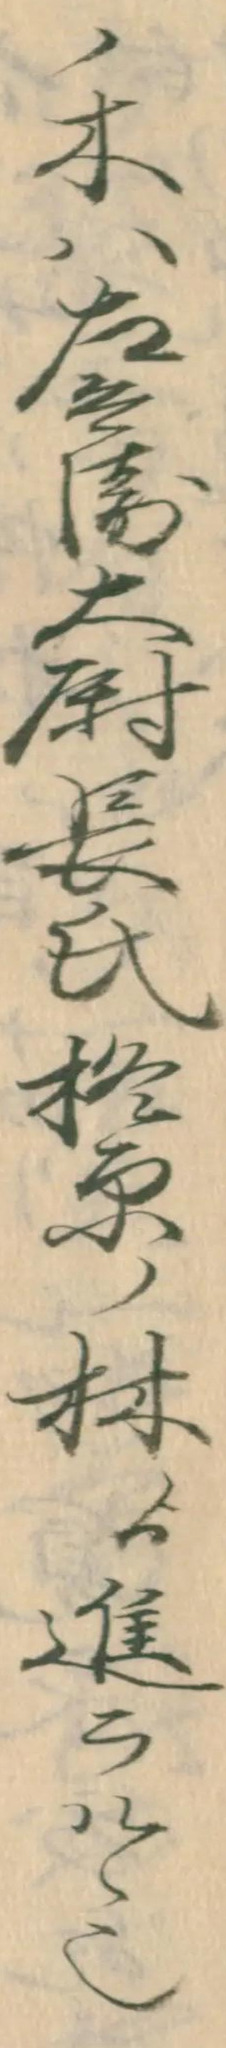ノ木ハ左兵衛大尉長氏柊原ノ林ゟ進ラルヽ也
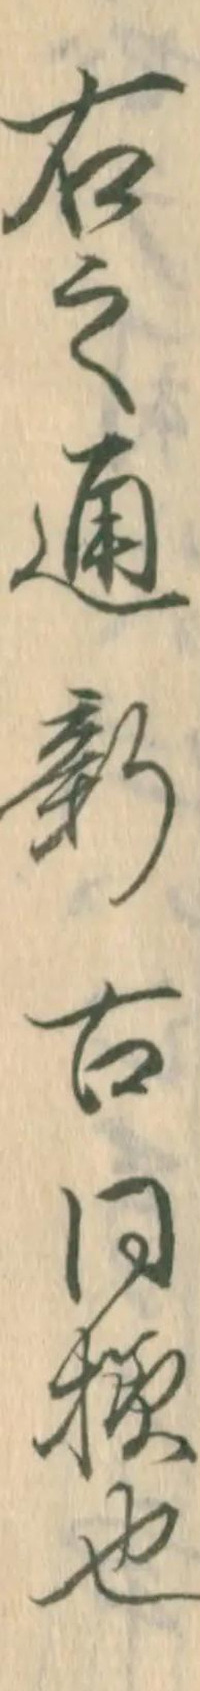右之通新古同様也
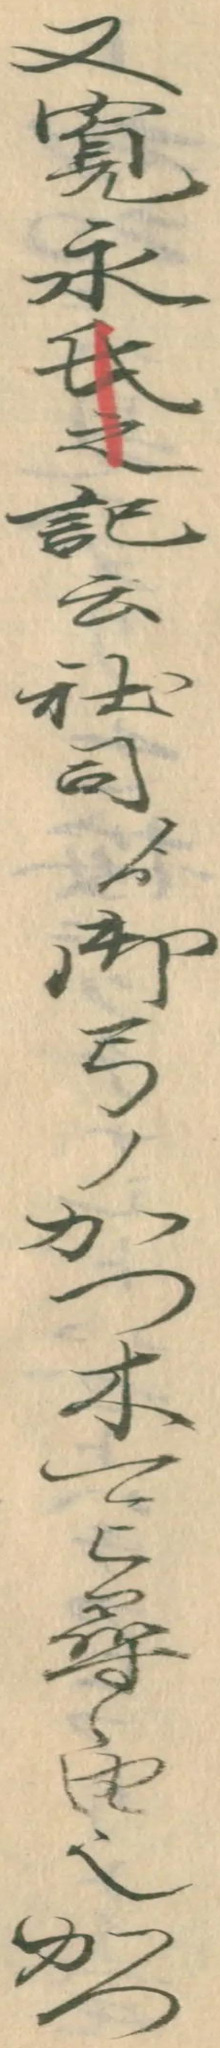又寛永氏之記云社司ゟ御弓ノかつ木可被尋候由也かつ
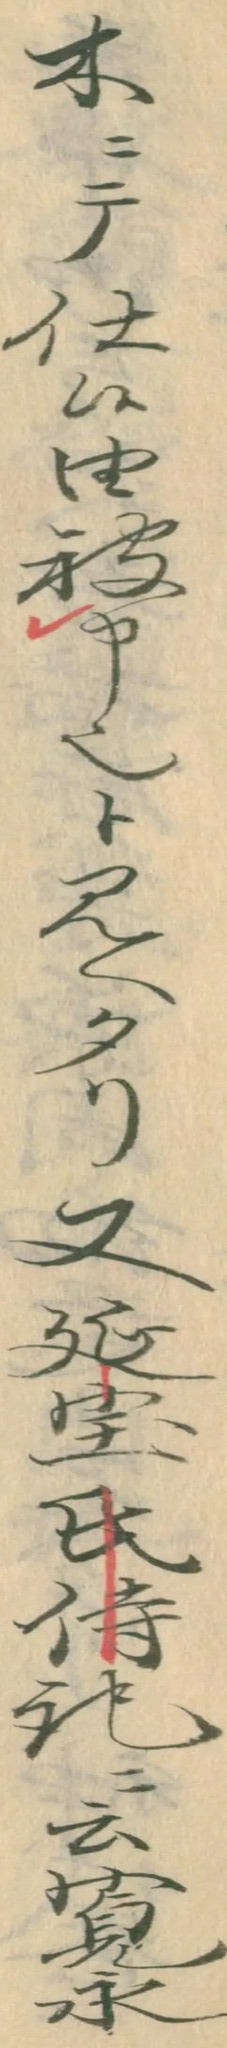木ニテ仕候由被申也ト見へタリ又延-宝氏侍記ニ云寛永

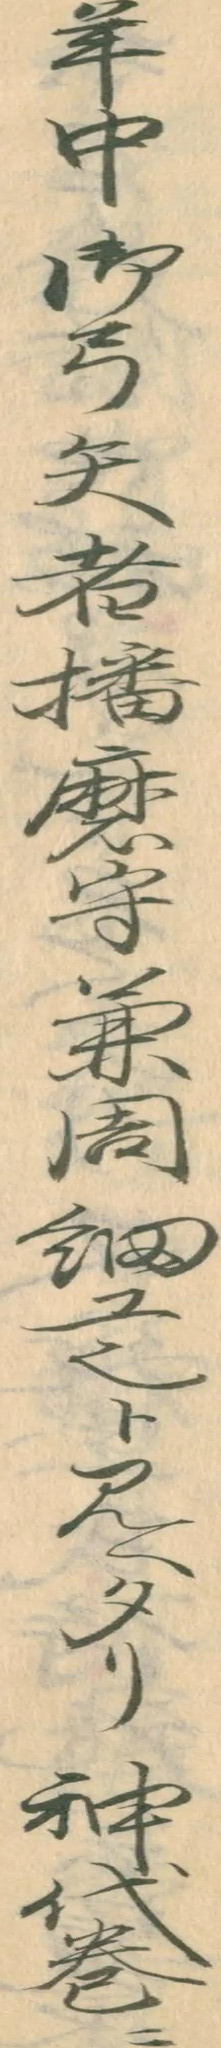年中御弓矢者播磨守兼周細工也ト見ヘタリ神代巻ニ
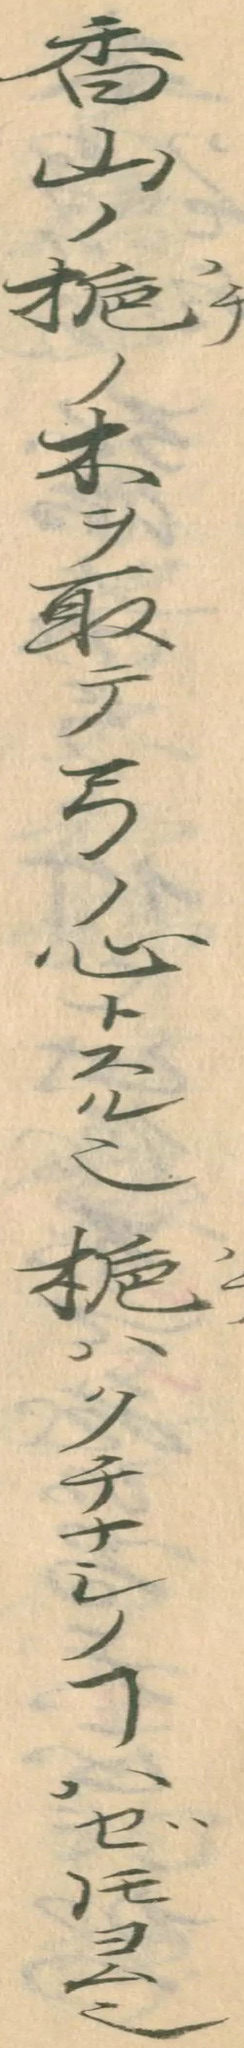香山ノ梔ノ木ヲ取テ弓ノ心トスル也梔ハクチナシノコトハゼトモヨム也
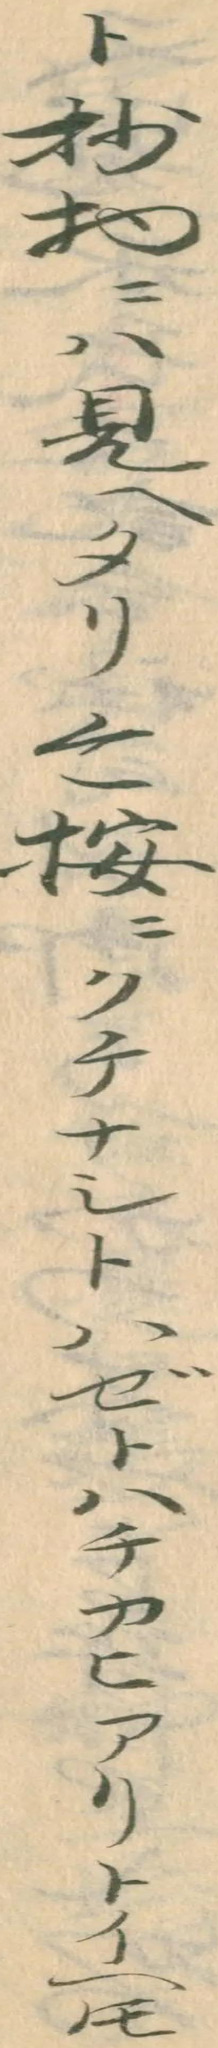ト抄物ニハ見ヘタリ今按ニクチナシトハゼトハチカヒアリトイヘトモ
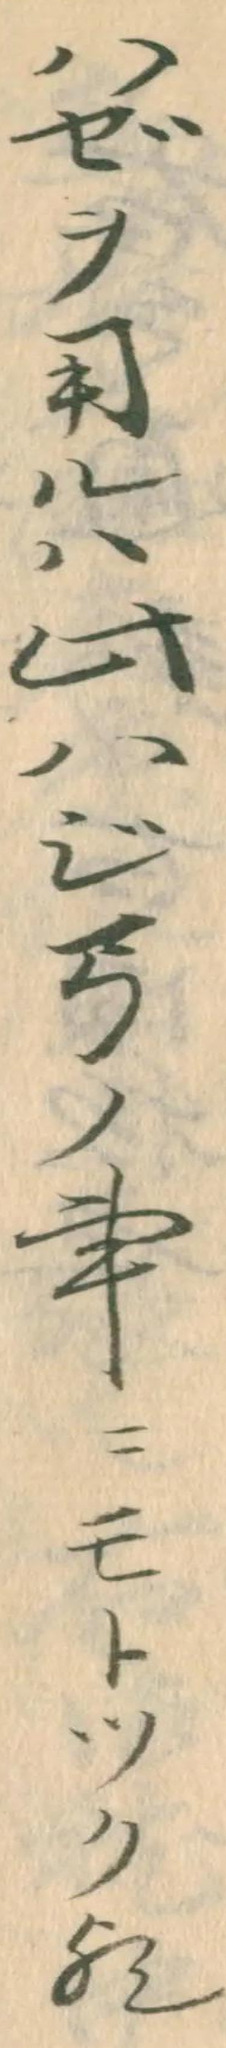ハゼヲ用ルハ此ハジ弓ノ事ニモトツク歟
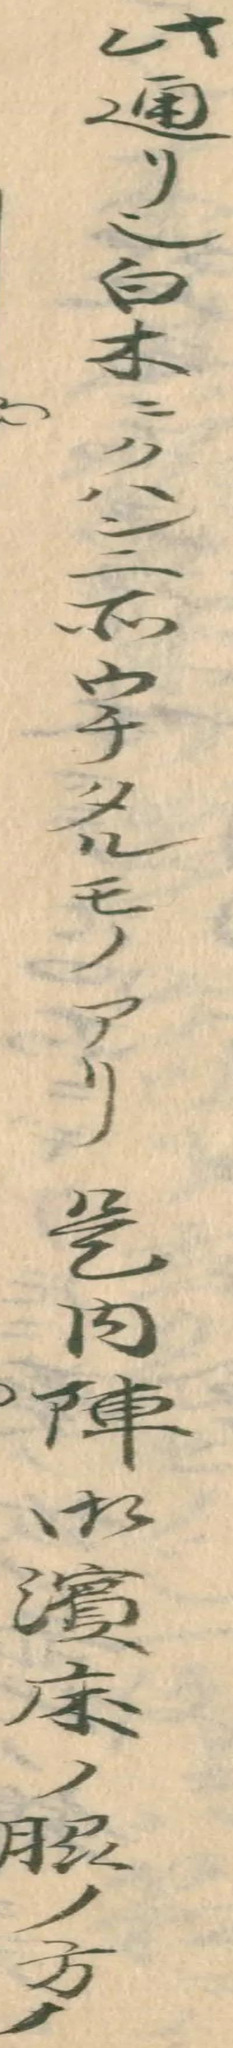此通リ也白木ニクハン二所ウチタルモノアリ是内陣御浜床ノ服ノ方ノ
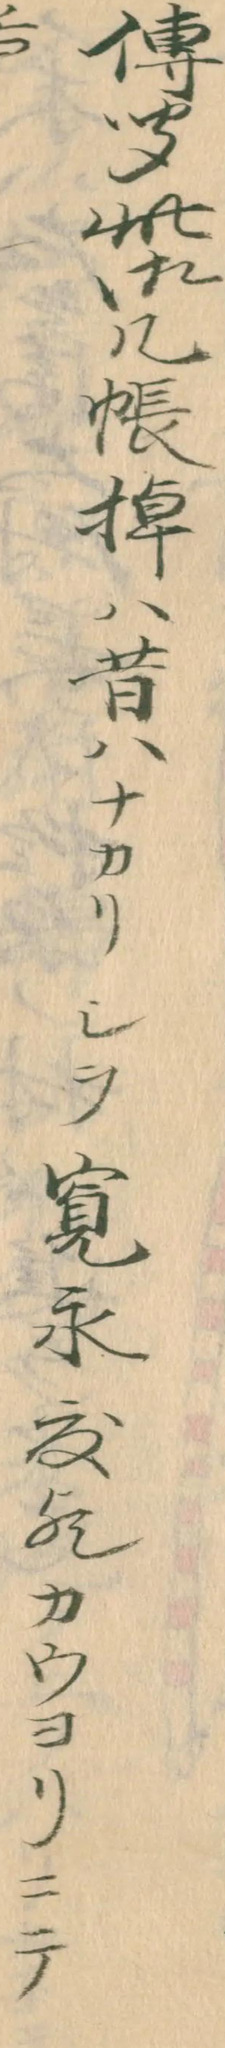伝聞此御几帳棹ハ昔ハナカリシヲ寛永度歟カウヨリニテ
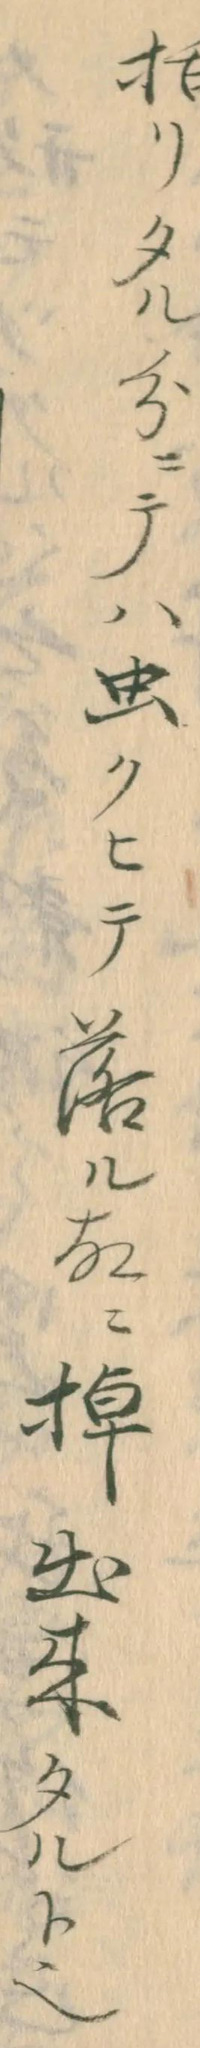括リタル分ニテハ虫クヒテ落ル故ニ棹出来タルト也
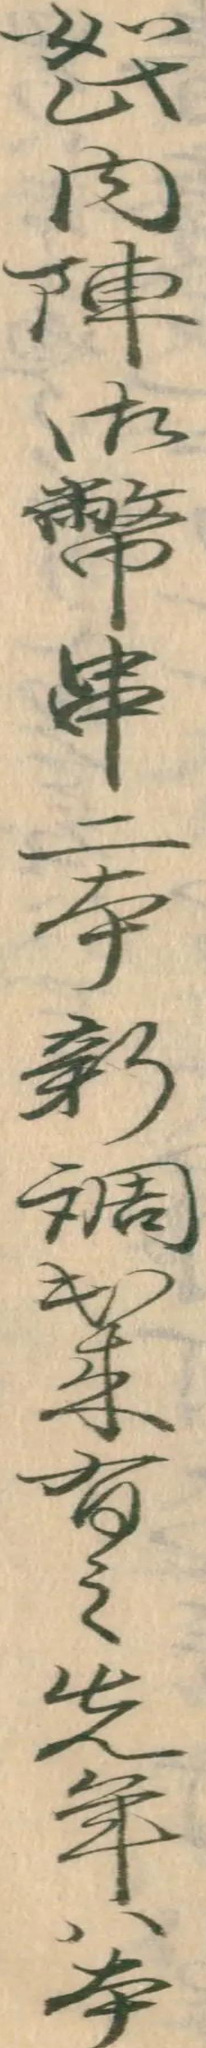如此内陣御幣串二本新調出来有之先年ハ本
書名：賀茂社記録. 第15冊
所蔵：国立国会図書館 National Diet Library, JAPAN
